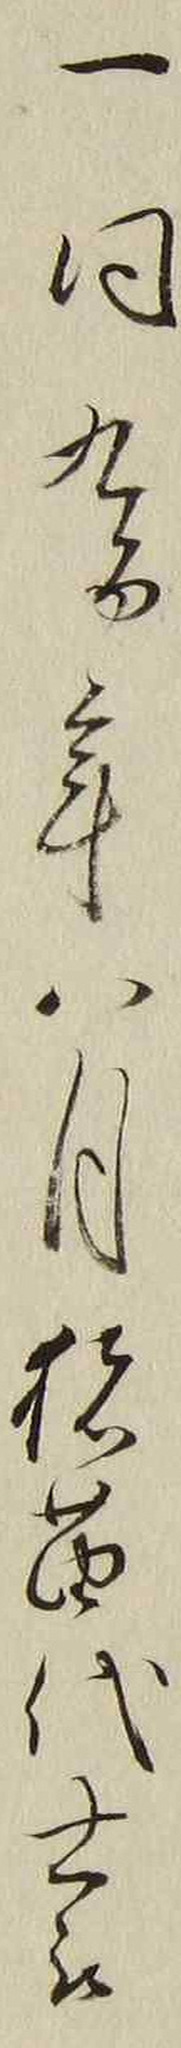一同九酉年八月猪苗代士被
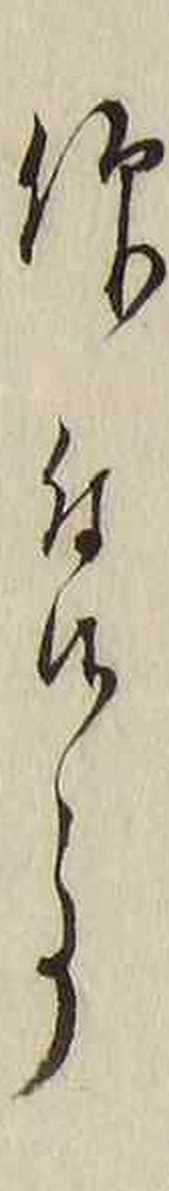仰付候事
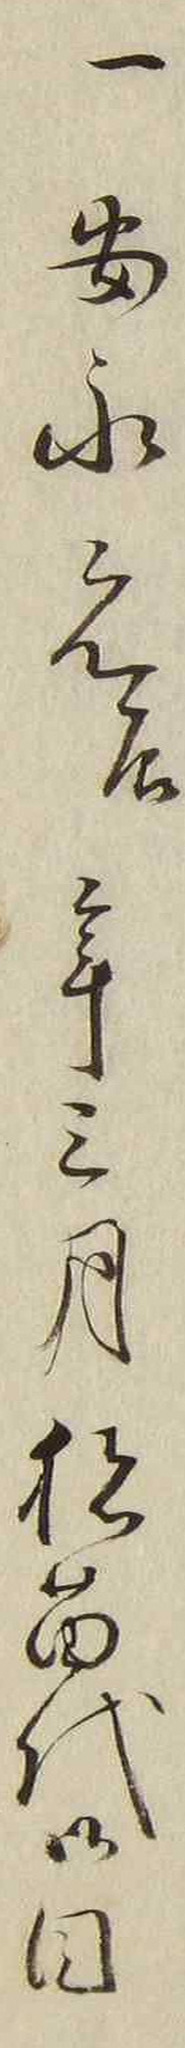一安永元辰年三月猪苗代御目

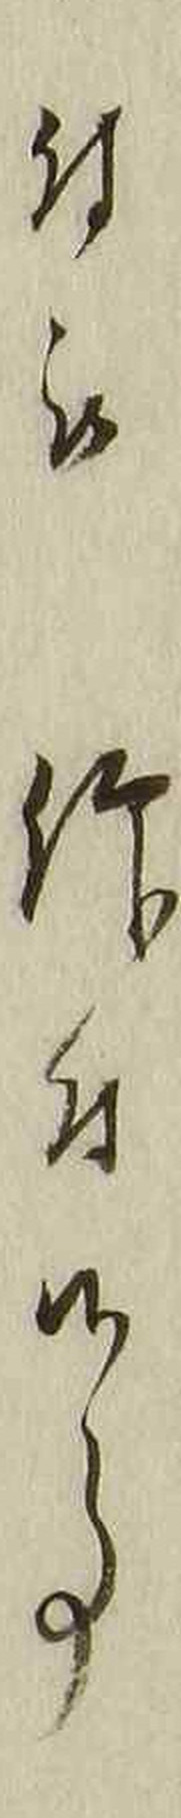付被仰付候事
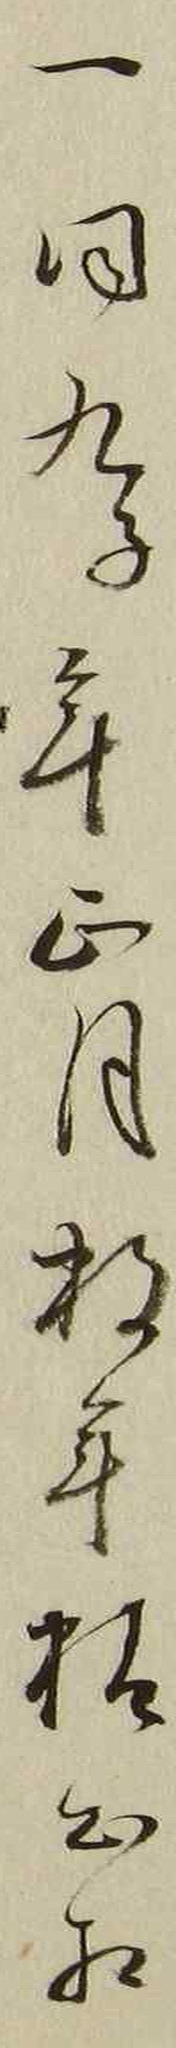一同九子年正月数年精出相
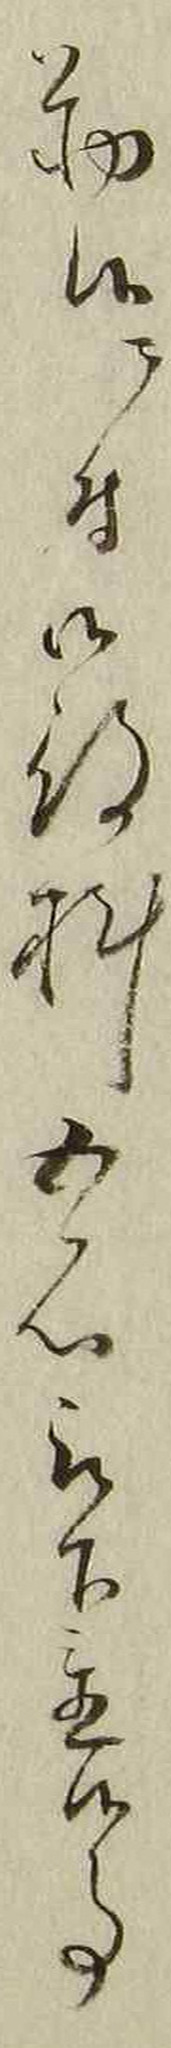勤候ニ付御役料五石被下置候事
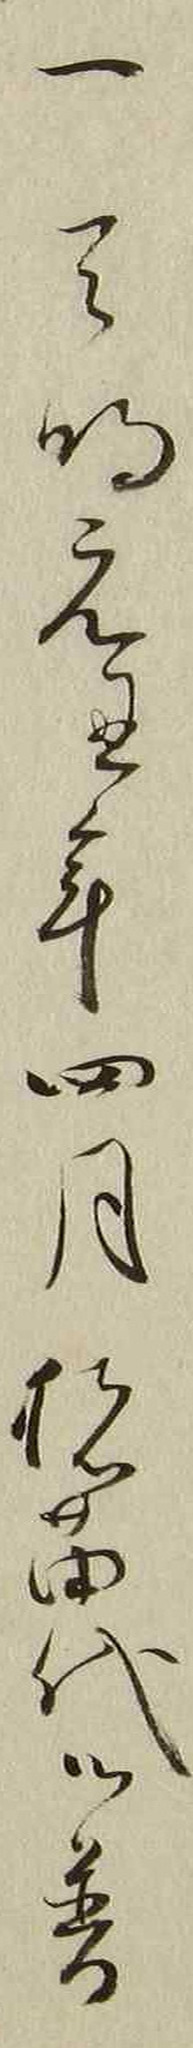一天明元丑年四月猪苗代御普
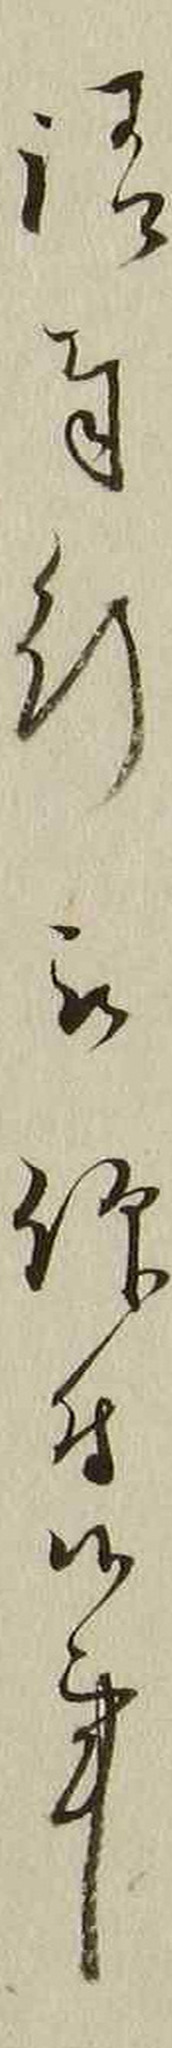請奉行被仰付候事
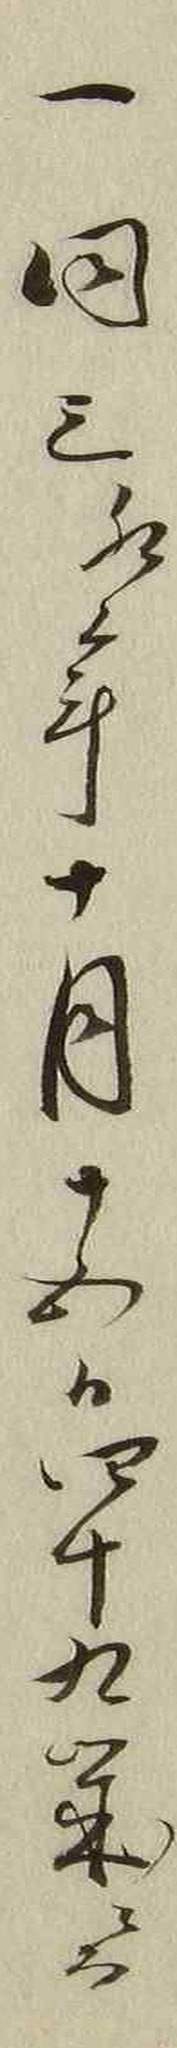一同三卯年十月十五日四十九歳ニ而
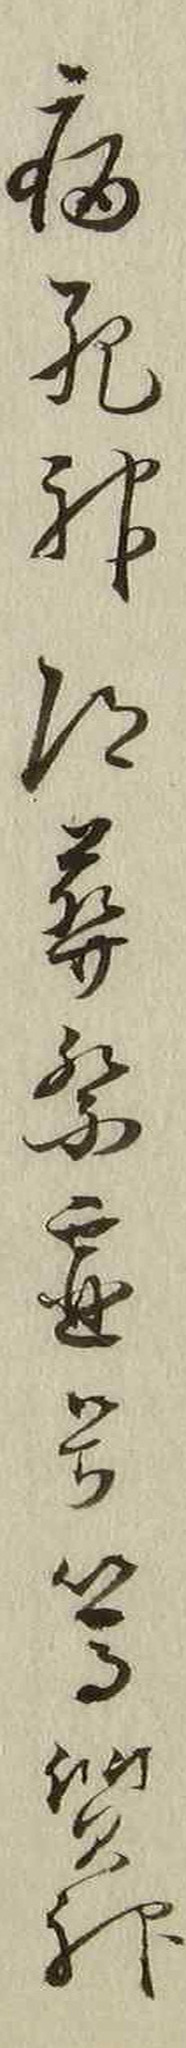病死神道葬祭霊号等質神
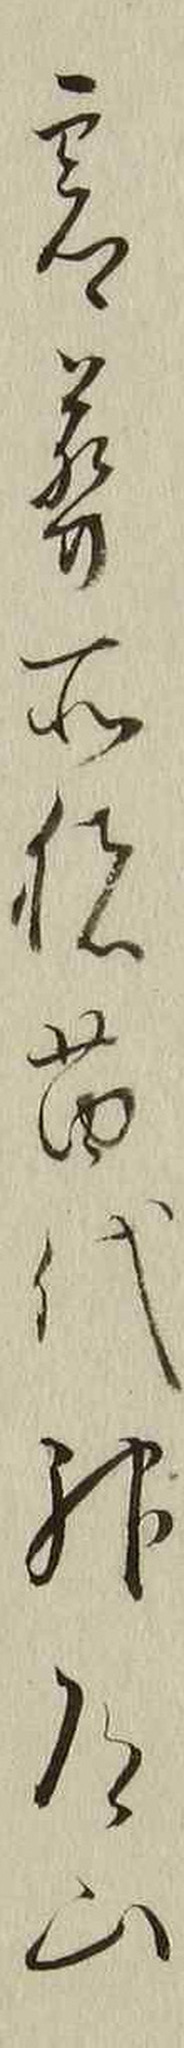宮葬所猪苗代神道山
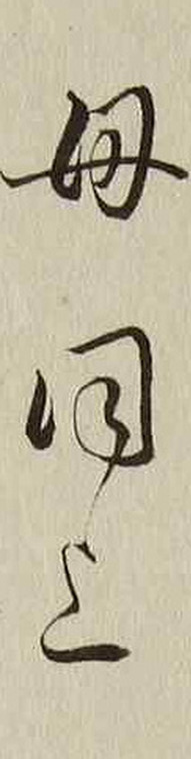母同上
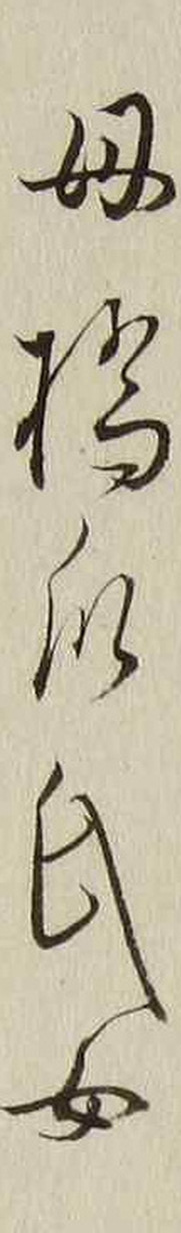母橋爪氏女
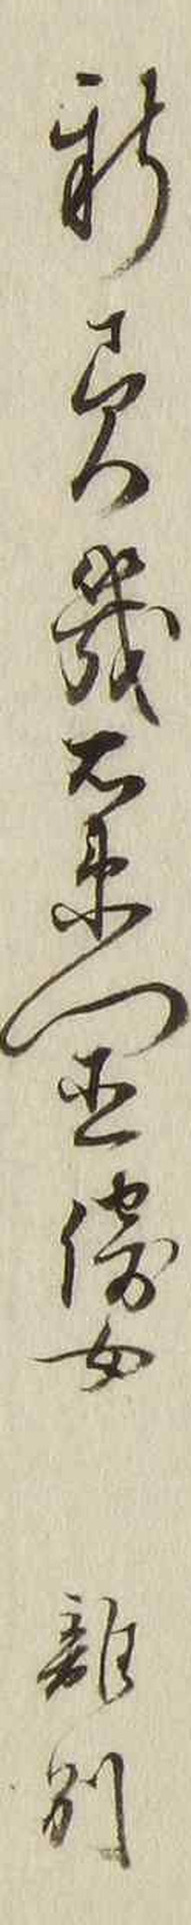新美幾右衛門直衛女離別

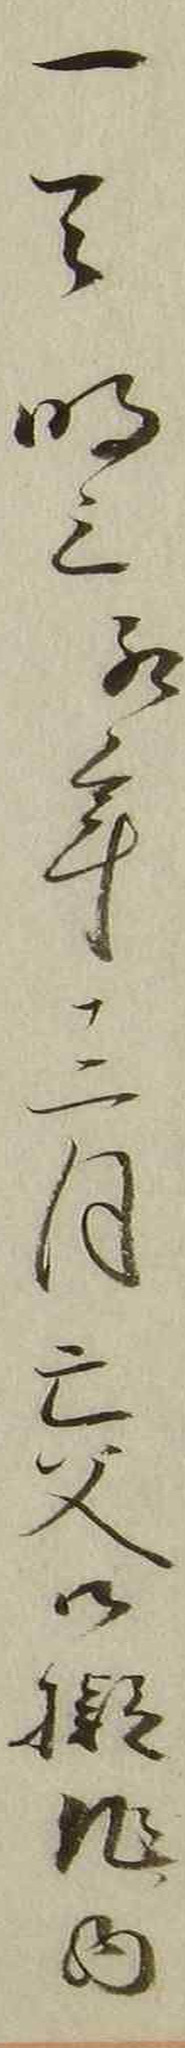一天明三卯年三月亡父御擬作内
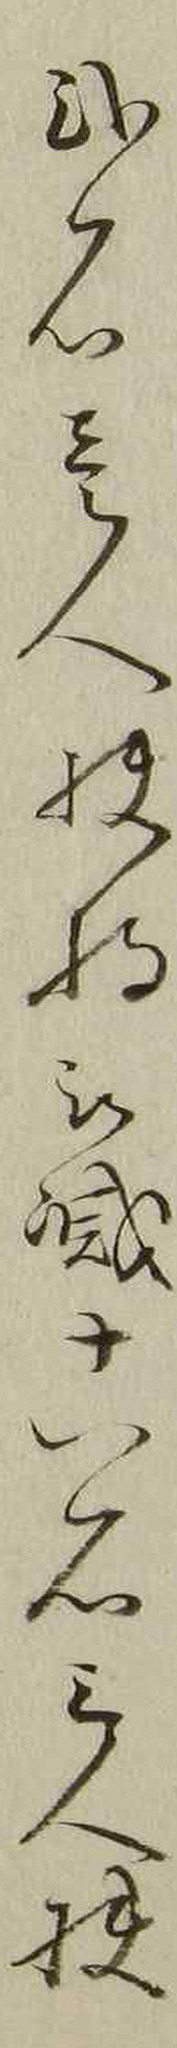弐石壱人扶持被減十八石三人扶
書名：諸士系譜　巻之129　た之部5
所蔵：会津若松市立会津図書館
